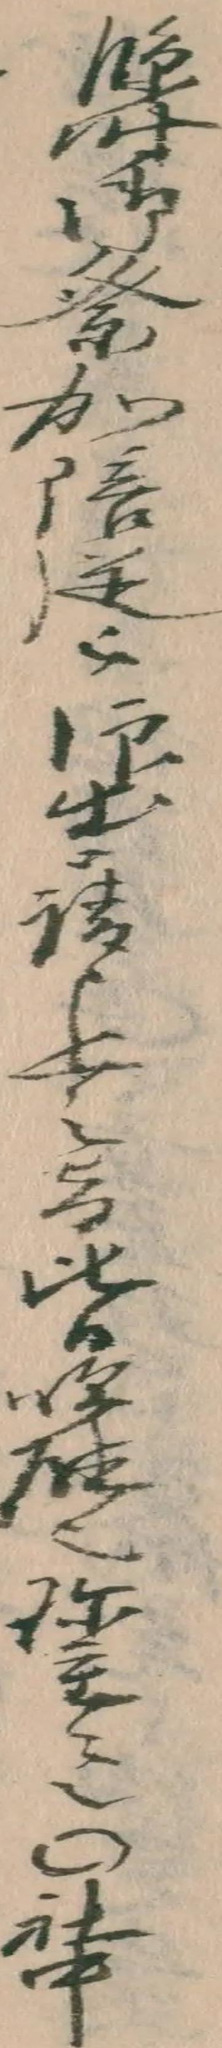臨時御祭加陪従被仰出御請申上之旨此日吹聴也弥重々々○社中
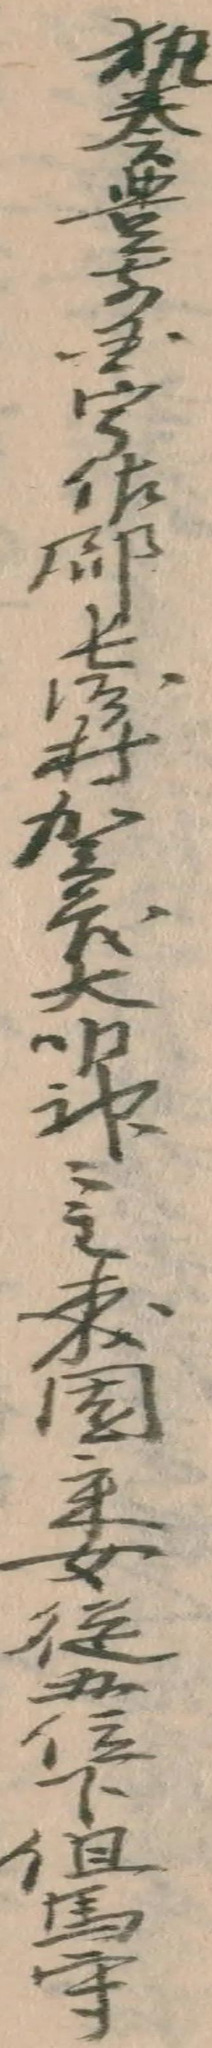執奏豊前国宇佐郡長渡村賀茂大明神々主森園采女従五位下但馬守
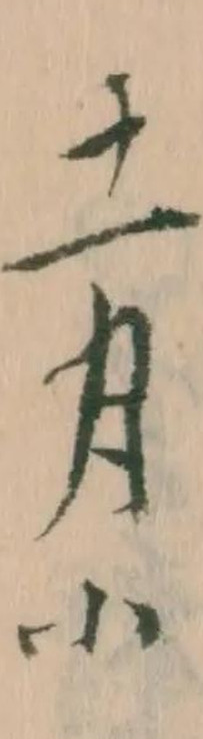十一月小
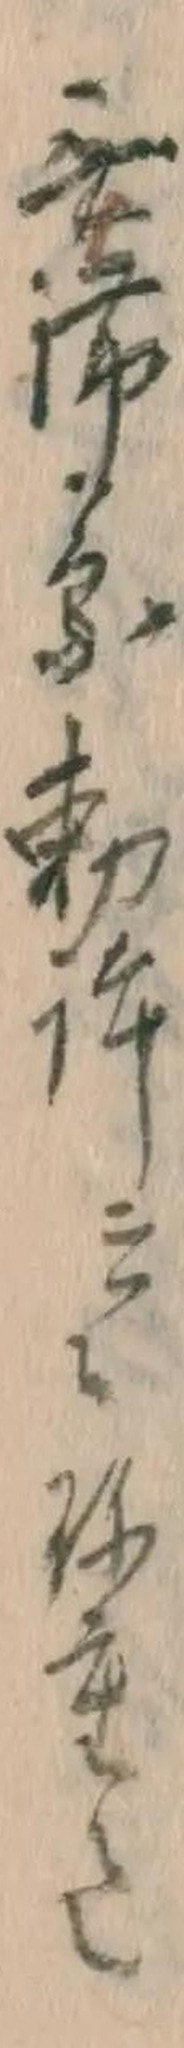無滞蒙勅許云々珍重々々
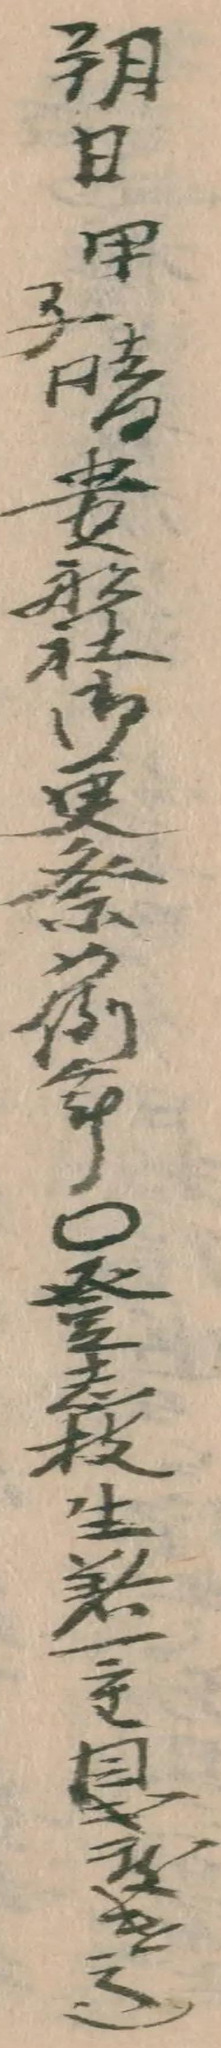一朔日甲子晴貴舩社御更祭如例年〇登志枝生着一重目出度遣之也
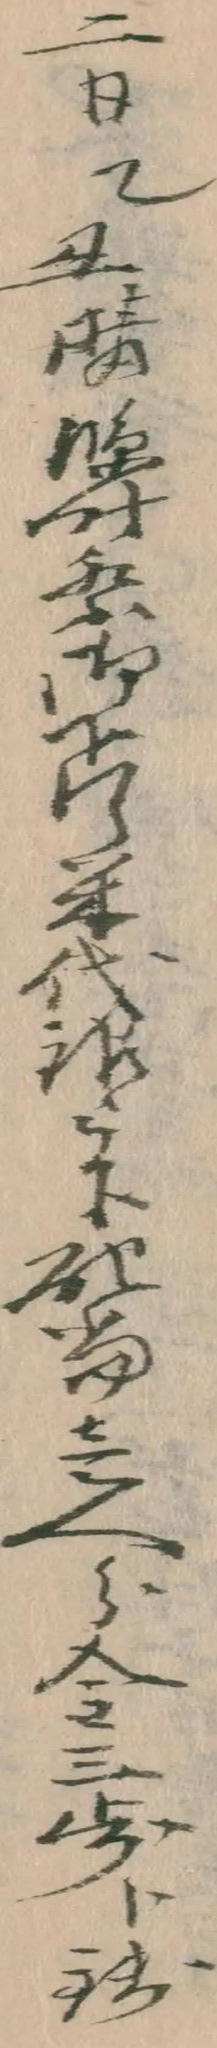二日乙丑晴臨時祭御下行米代銀被下配當壱人分金三歩ト銀
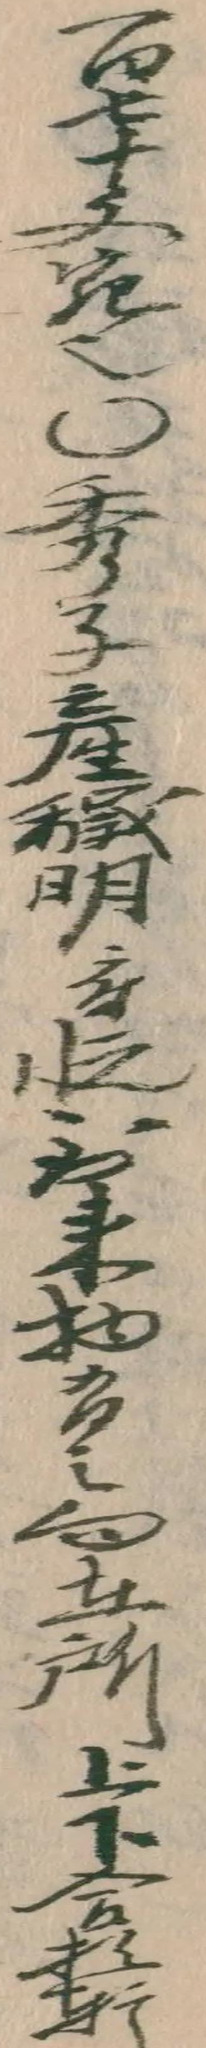百七十文宛也○秀子産穢明ニ付祝到来物有之向在所上下合数軒
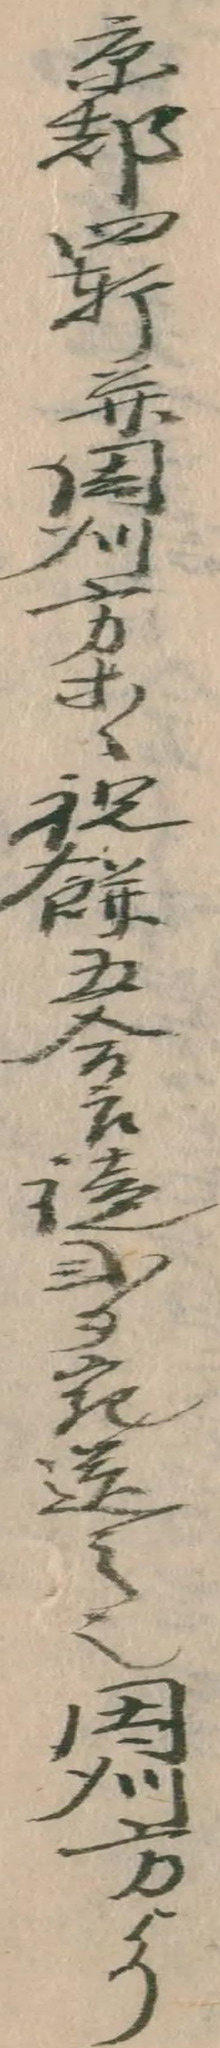京都四軒并因州方等へ祝餅五合召續弐夕宛送之也因州方より
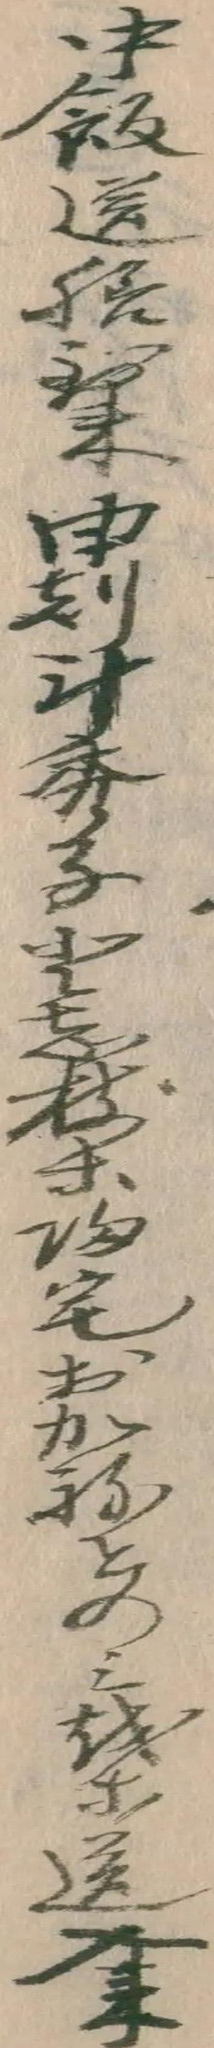中飯送膳到来申刻斗秀子登志枝等帰宅おかねとのミを等送入来
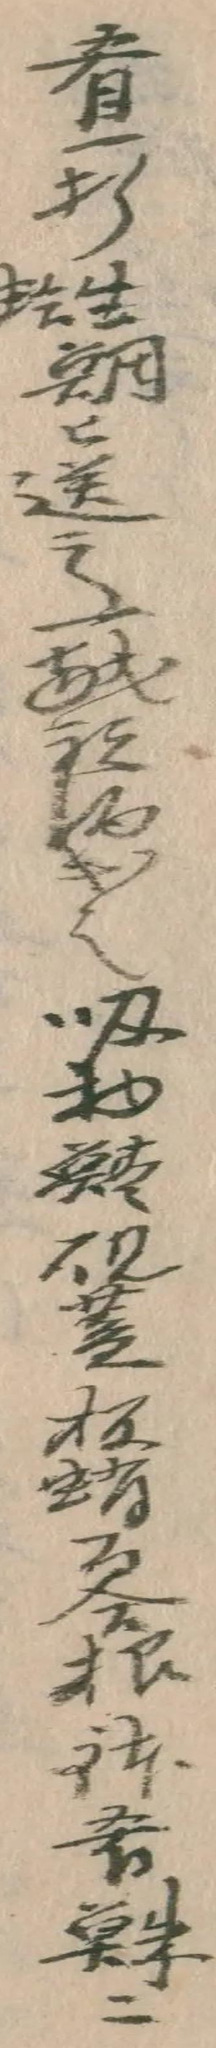肴一折生鯛蛤被送之一献祝酒出之吸物鯵硯蓋板蛸百合根鉢肴鮢ニ
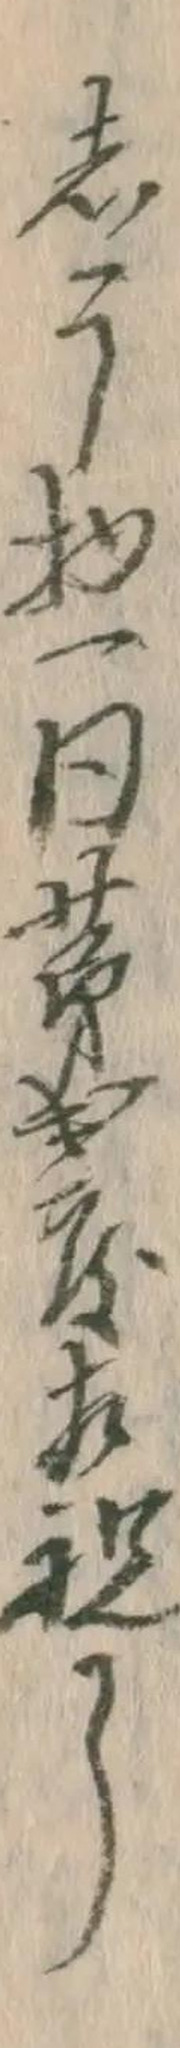したし物一同芽出度相祝了
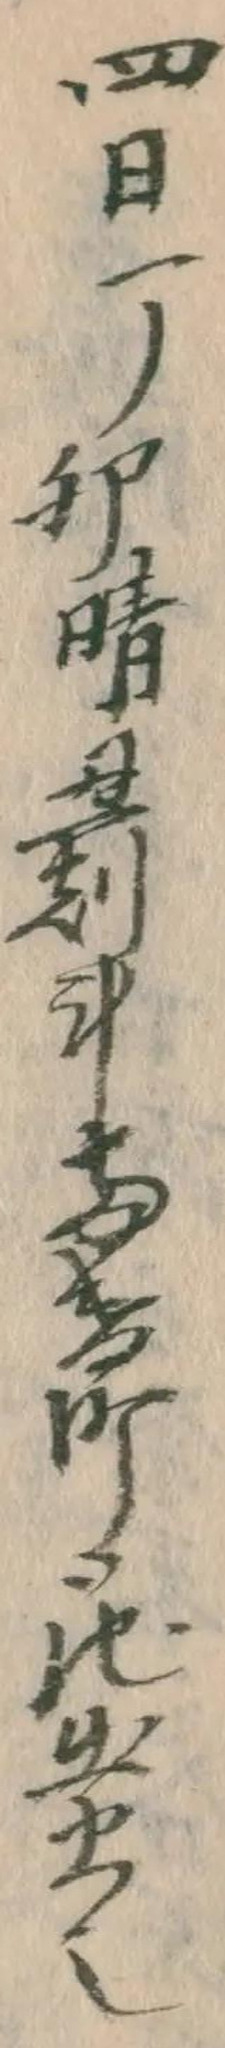四日丁卯晴丑刻斗両替町御地出火也
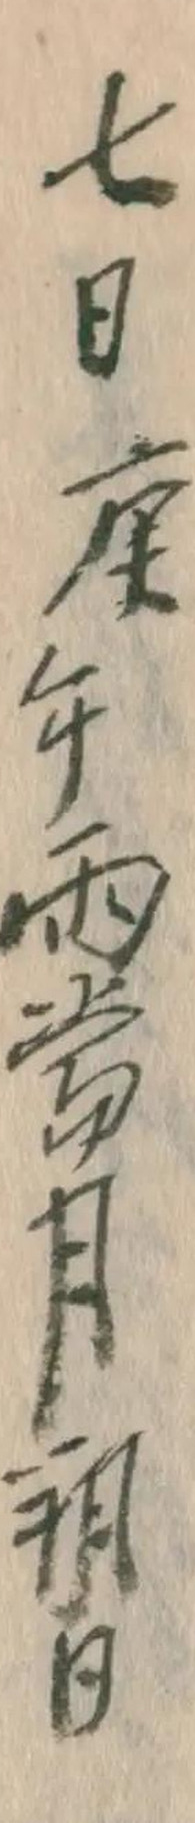七日庚午雨當月朔日
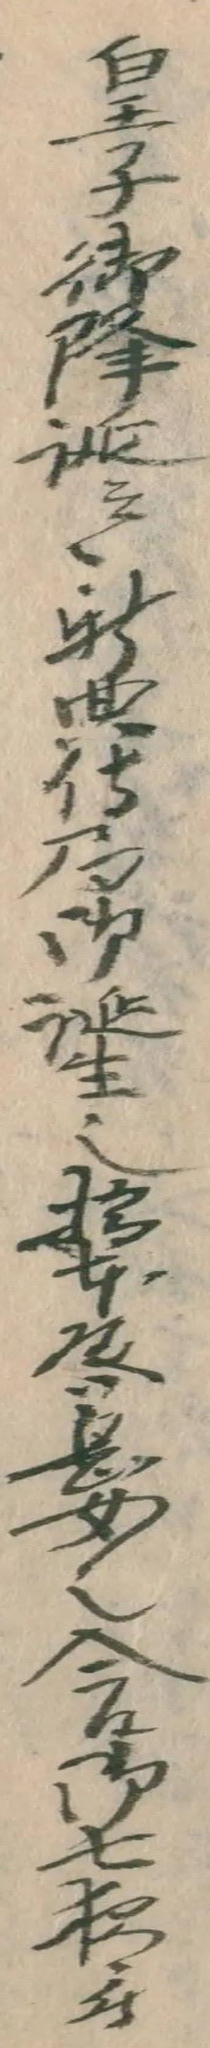皇子御降誕云々典侍局御誕生也橋本殿御息女也今日御七夜ニ付
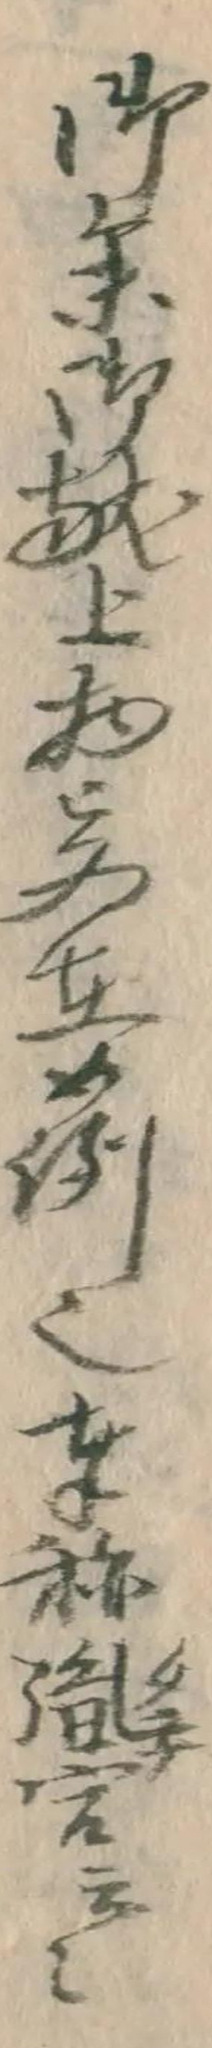御参御献上物被為在如例也奉称胤宮云々
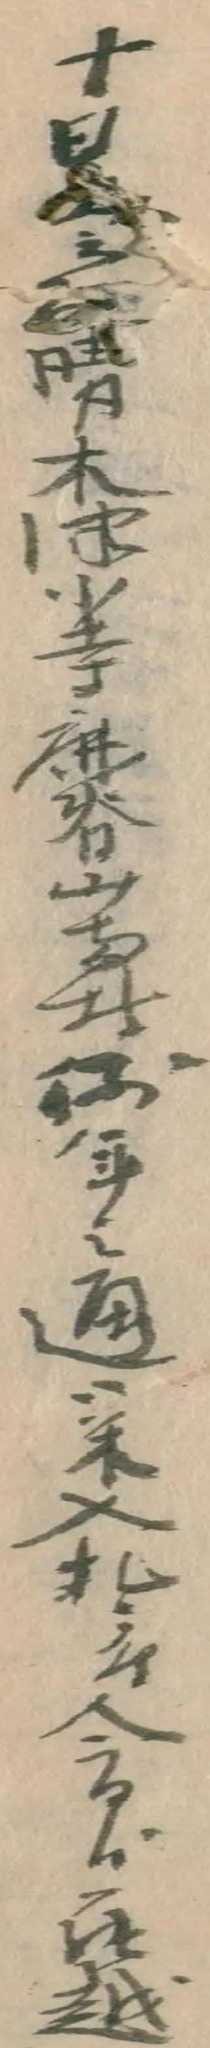十日壬酉晴木津小寺鹿脊山両村例年之通御米入札ニ付今日ゟ罷越
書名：賀茂社記録. 第69冊
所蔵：国立国会図書館 National Diet Library, JAPAN
